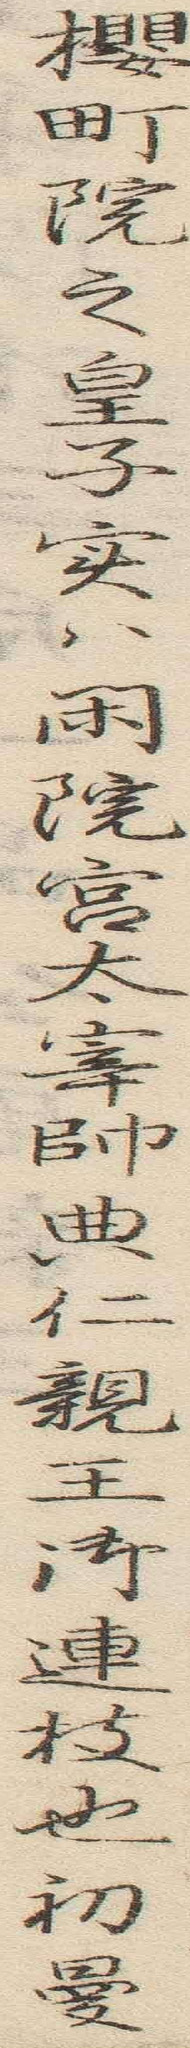櫻町院之皇子実は閑院宮太宰師典仁親王御連枝也初曼
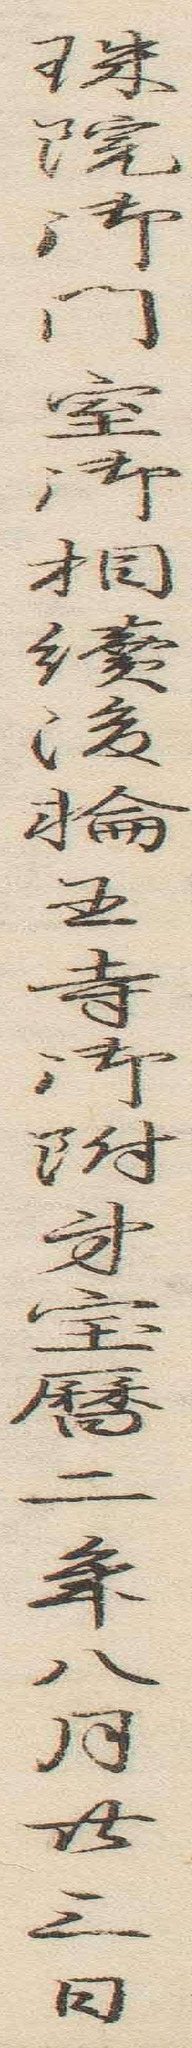珠院御門室御相續後輪王寺御附㐧宝歷二年八月廿三日
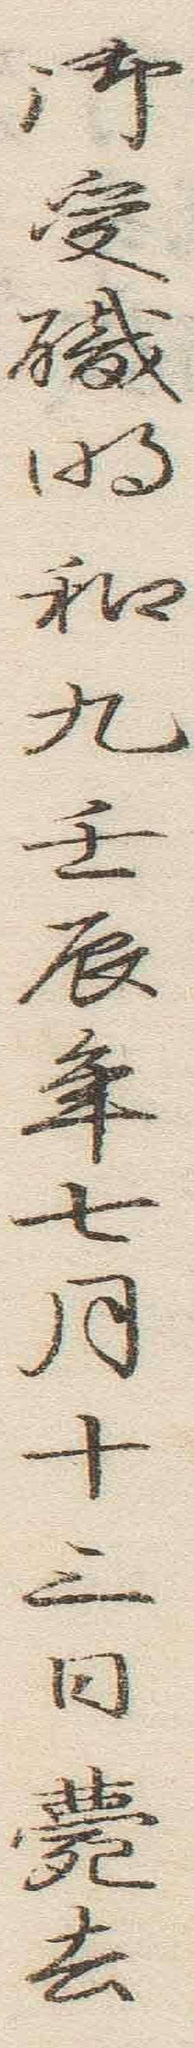御受職明和九壬辰年七月十三日薨去
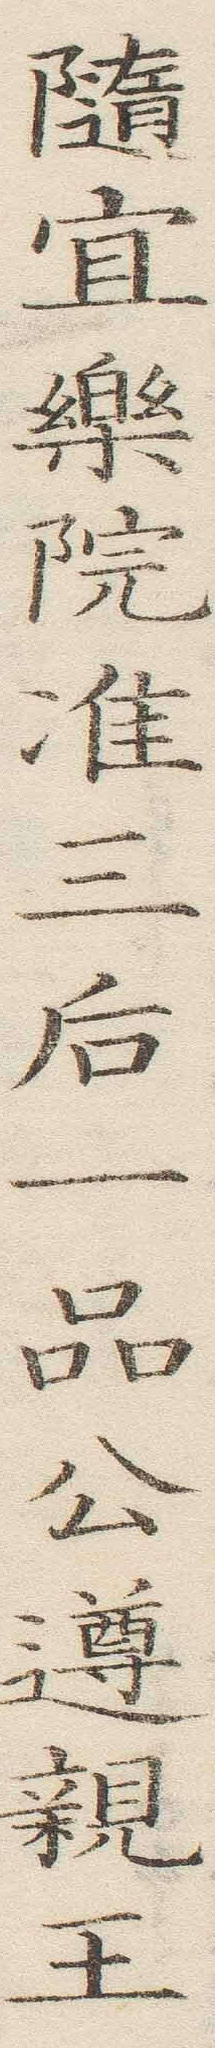隨宜樂院准三后一品公遵親王
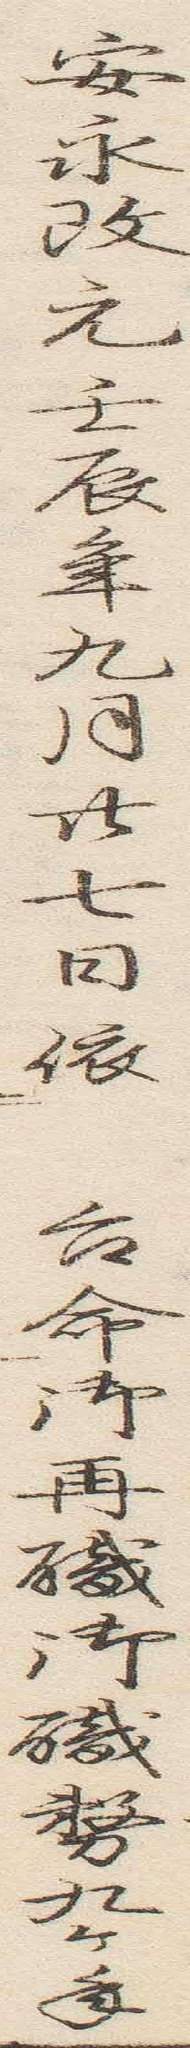安永改元壬辰年九月廿七日依台命御再職御職務九ヶ年
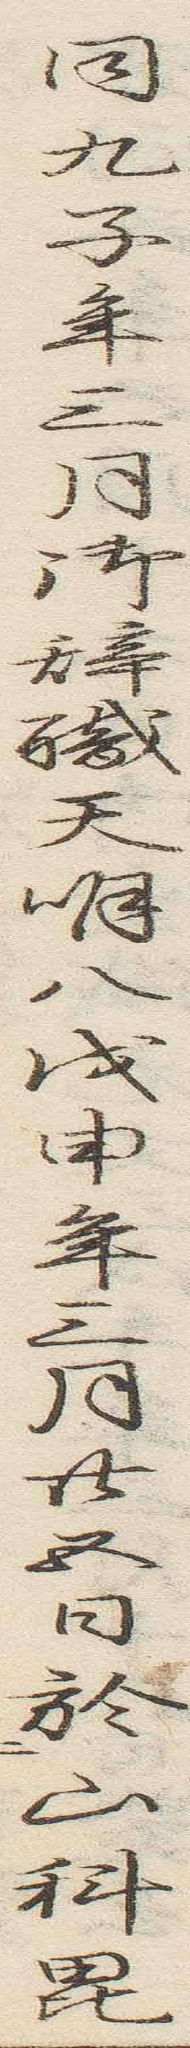同九子年三月御辞職天明八戊申年三月廿五日於山階毘
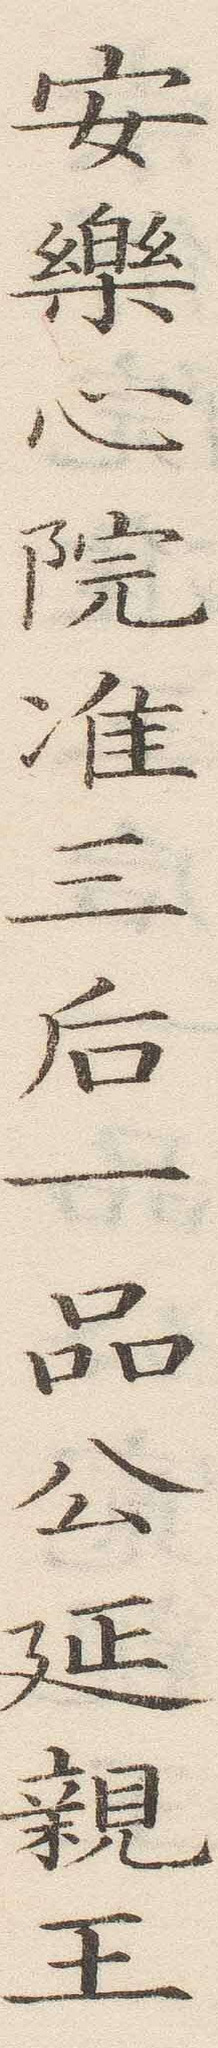安樂心院准三后一品公延親王
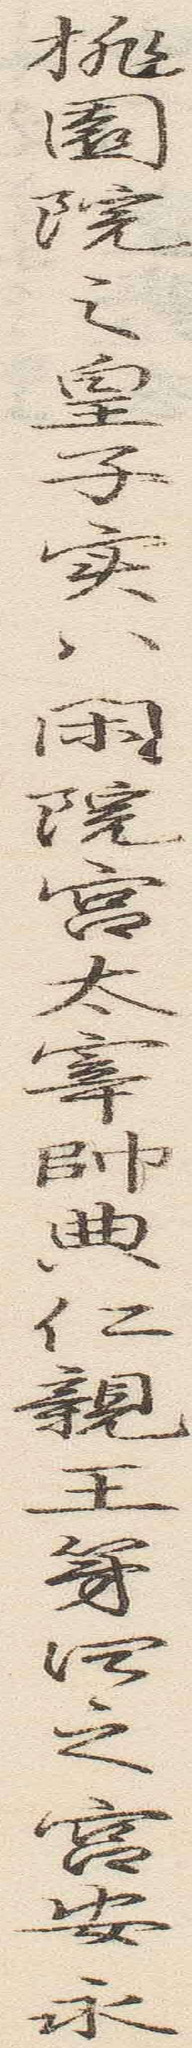桃園院之皇子実は閑院宮太宰師典仁親王第四之宮安永
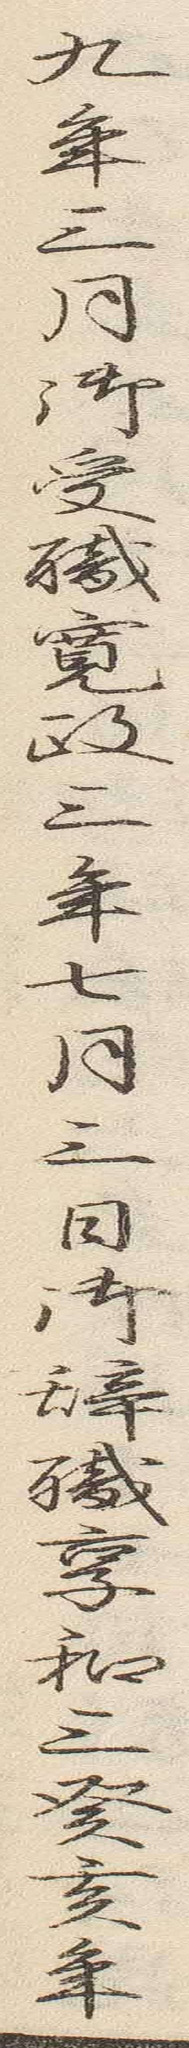九年三月御受職寛政三年七月三日御辞職享和三癸亥年
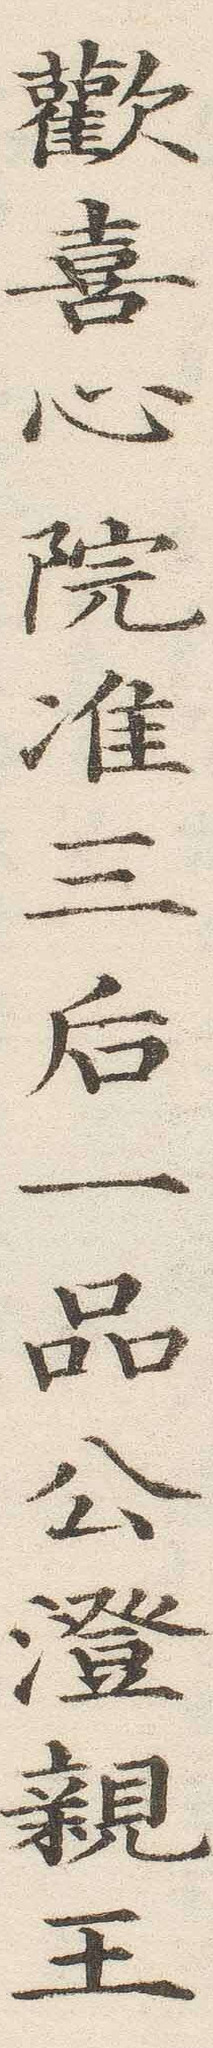歡喜心院准三后一品公澄親王
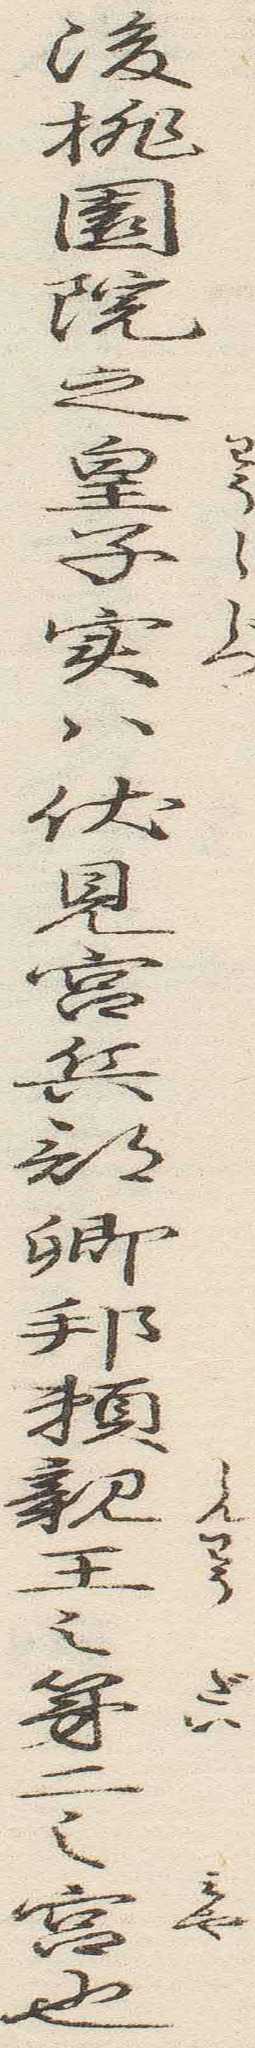後桃園院之皇子実は伏見宮兵部卿邦頼親王之第二之宮也
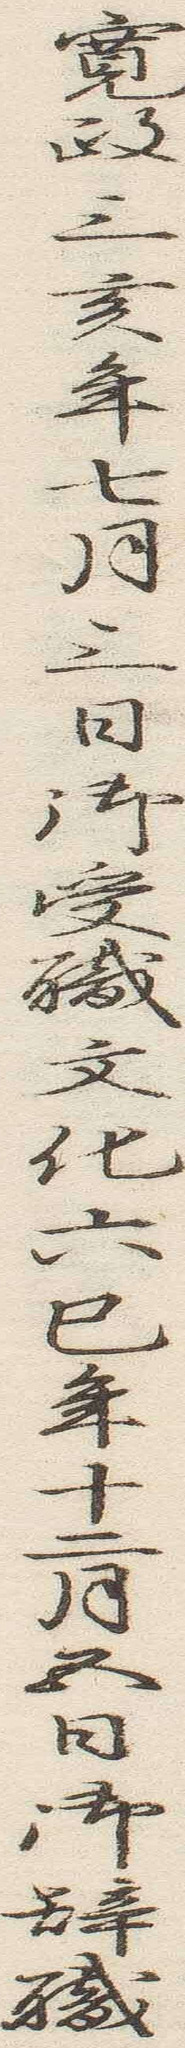寛政三亥年七月三日御受職文化六巳年十二月五日御辞職
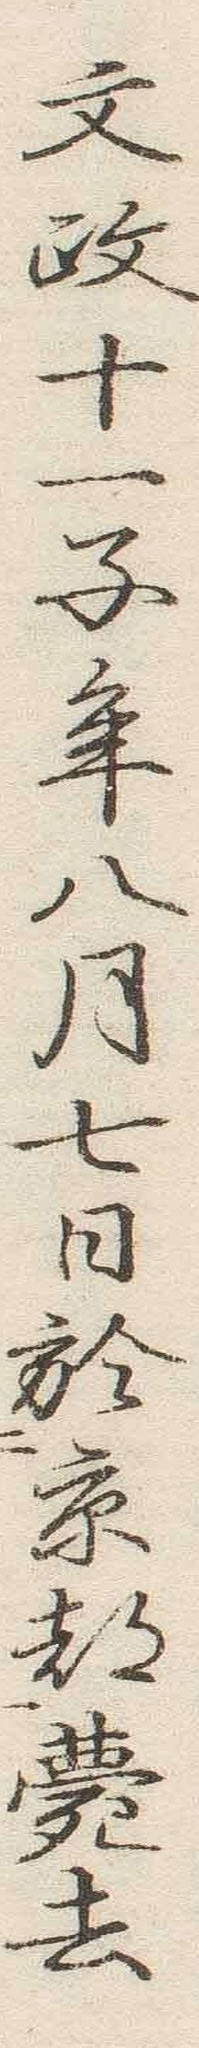文政十一子年八月七日於京都薨去
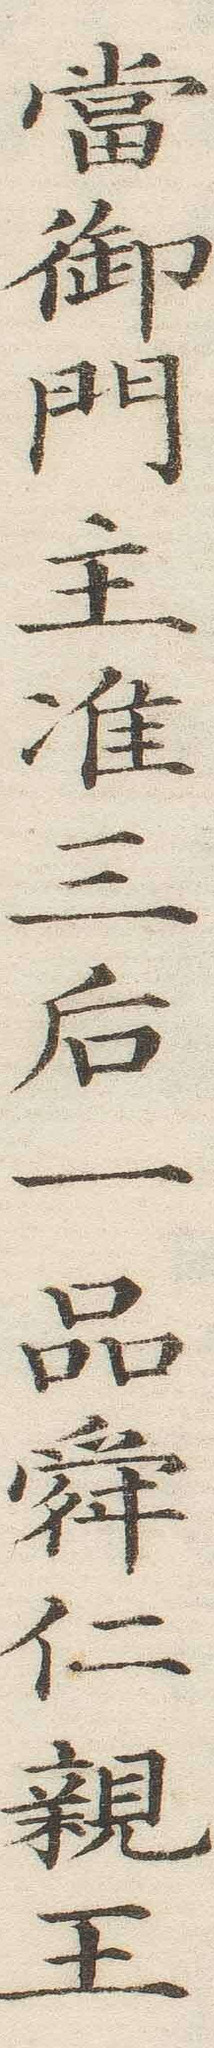當御門主准三后一品舜仁親王
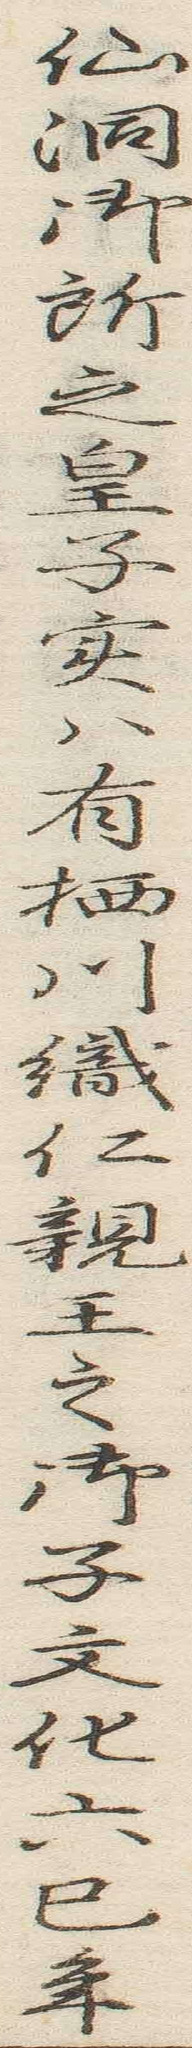仙洞御所之皇子実は有栖川織仁親王之御子文化六巳年
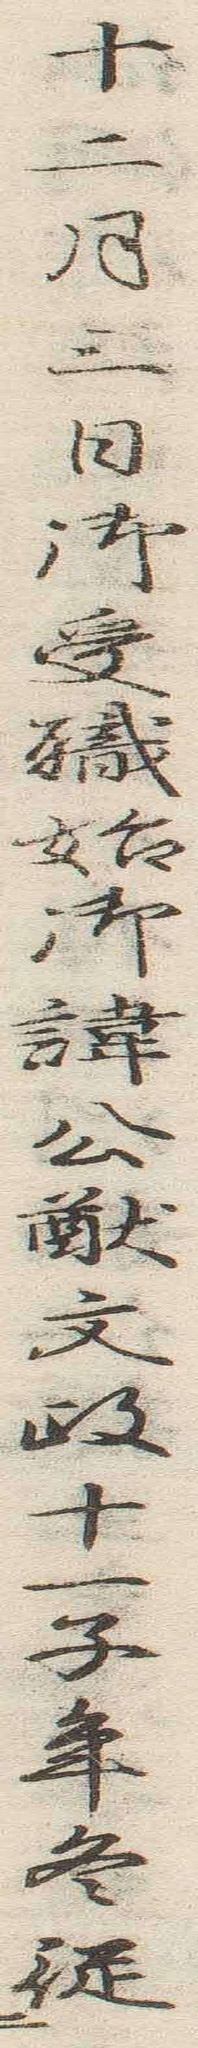十二月三日御受職始御諱光猷文政十一子年冬従
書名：日光山志
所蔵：東京学芸大学附属図書館 国文学研究資料館
